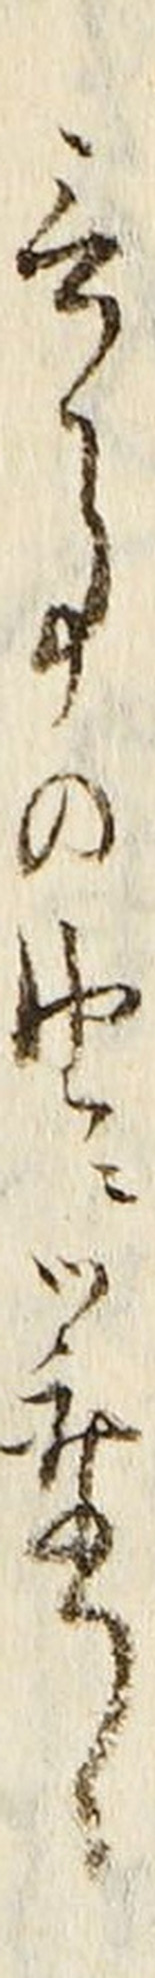言事の由ニ御座候
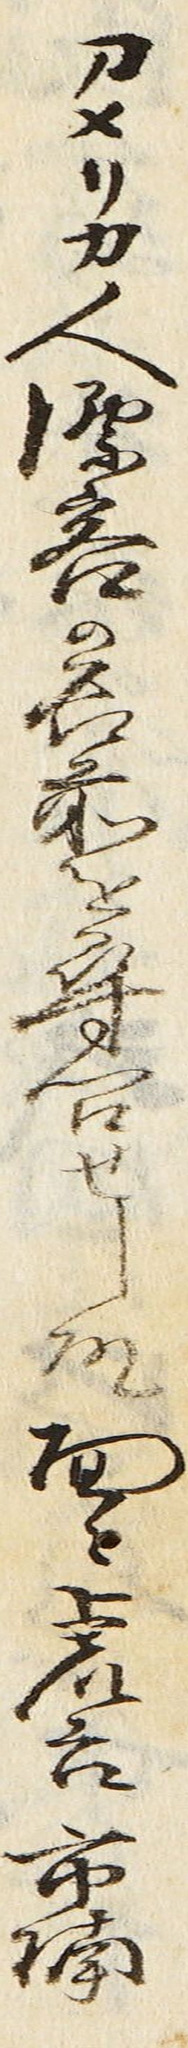アメリカ人漂客の名前を尋問せし故面々虎吉市楠
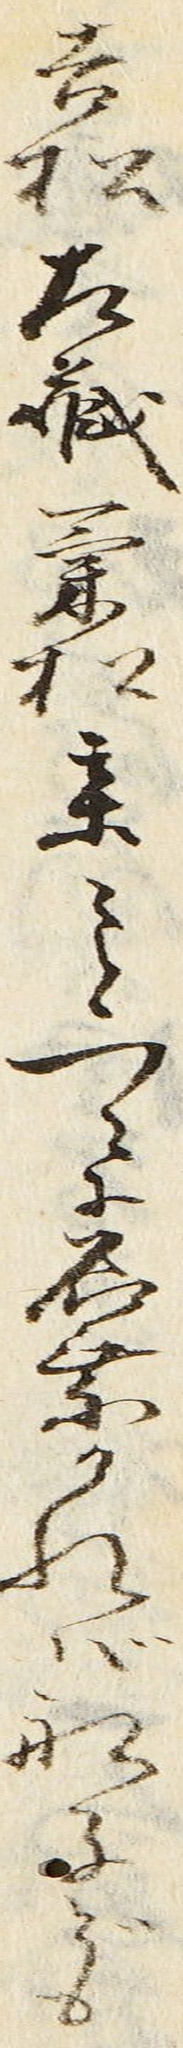吉松発左蔵菊松某々と一々に名乗けれバ船子ども
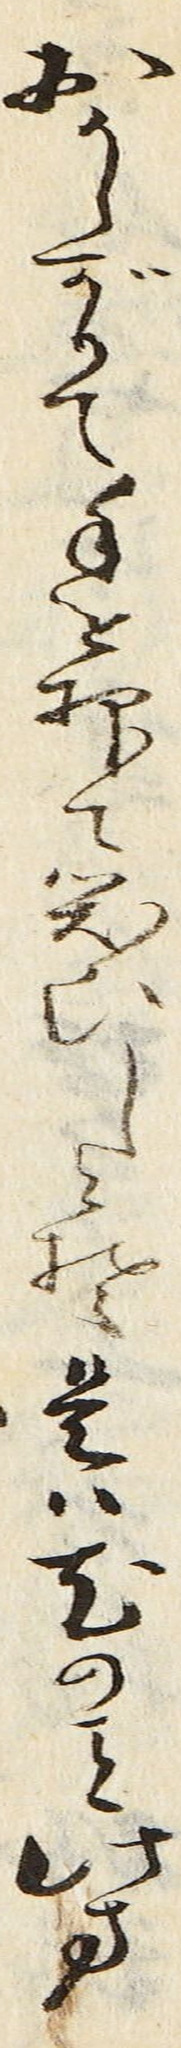おかしがりて手を叩て笑ひしとそ是ハ尤のこと此方
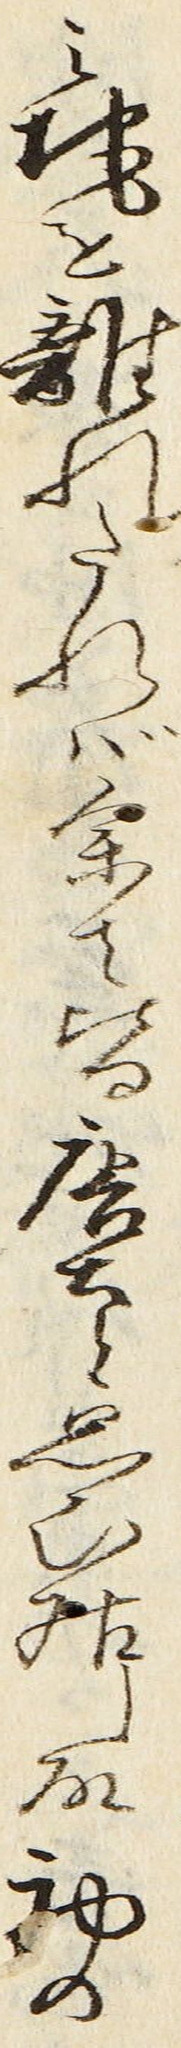之地を離れたれバ余者皆唐土と思ひ居し故初の
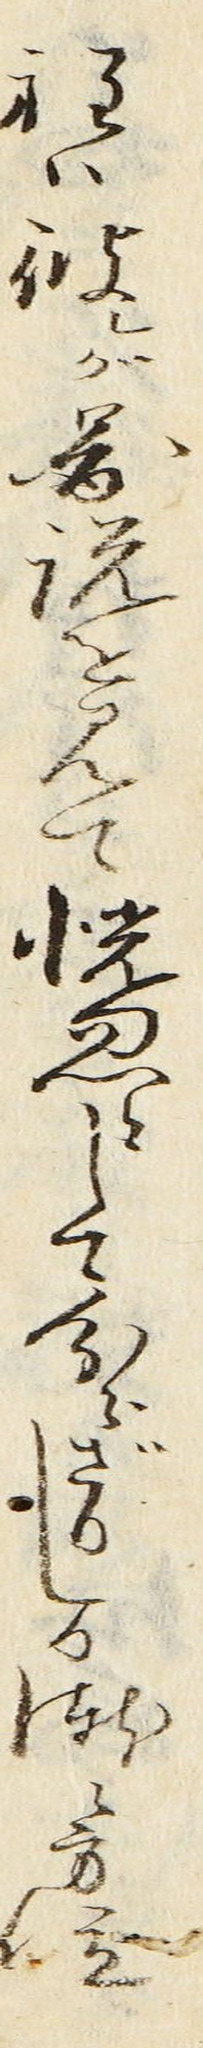程ハ彼レが図説を見て恍忽として分らざりしか漸々方位
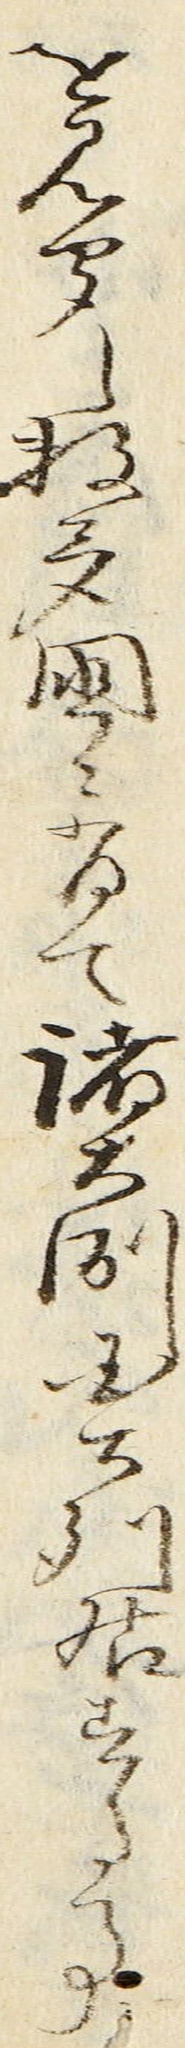を見聞し数多国々有て諸大州国大列居する事
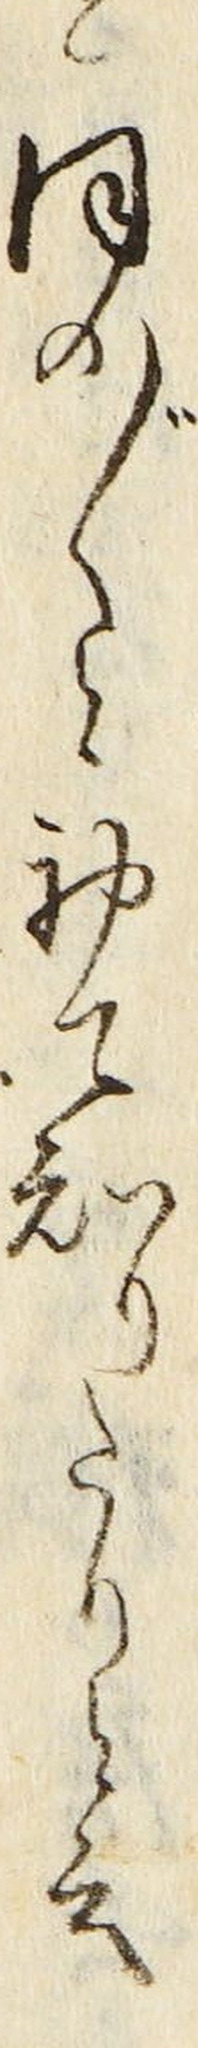をほの〴〵と初て知りたりと云
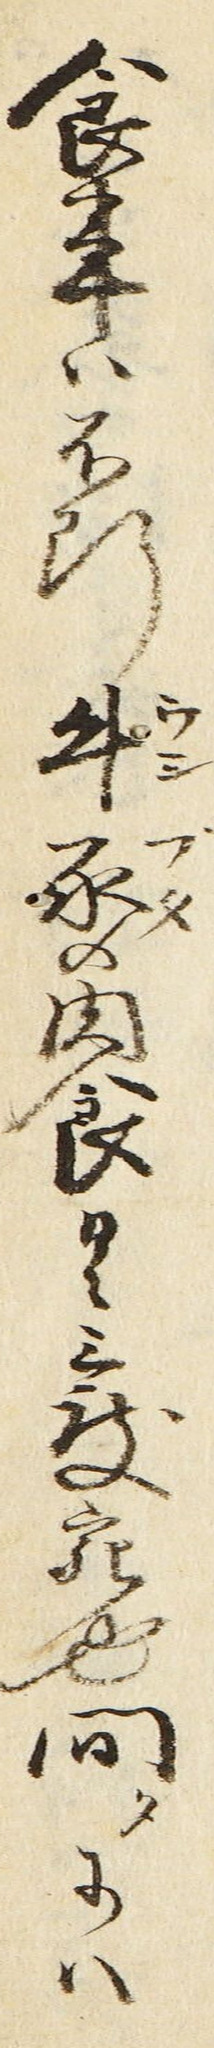食事ハ不断牛豕の肉食日々三度宛也間タにハ

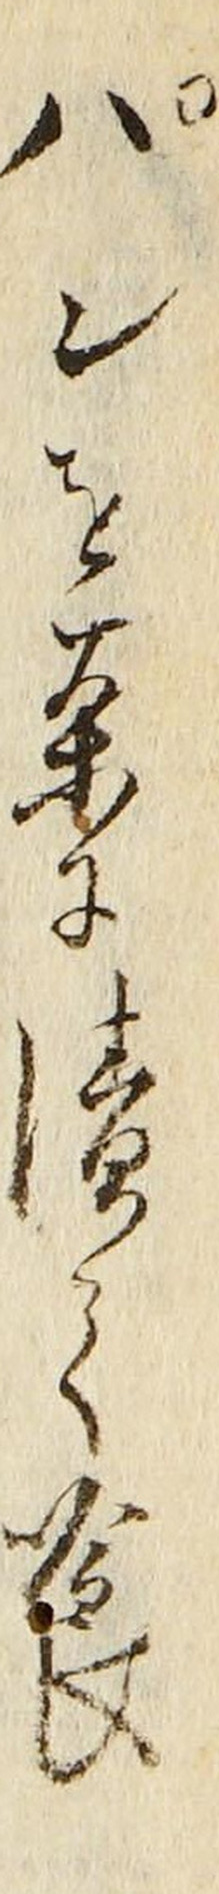パンを茶に漬て食
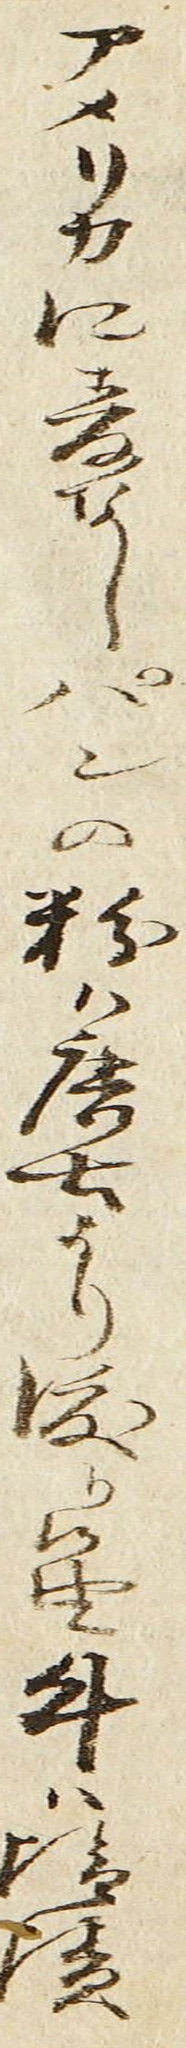アメリカに麦なしパン粉ハ唐土より渡り候由牛ハ塩漬
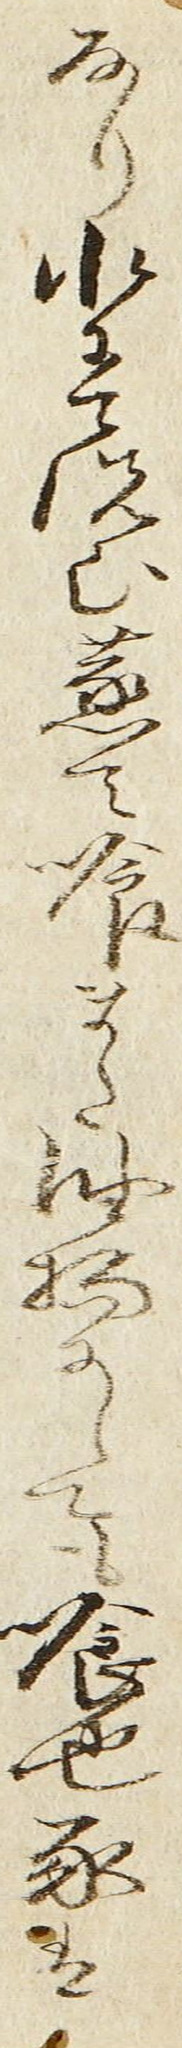なり水にて洗ひ蒸て喰また油揚にしても喰也豕は
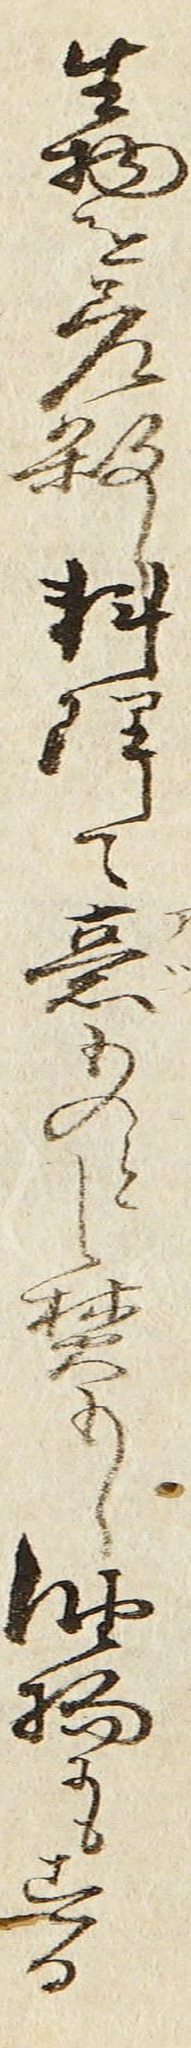生物を差殺し料理して烹ものとし焚もし油揚にもする
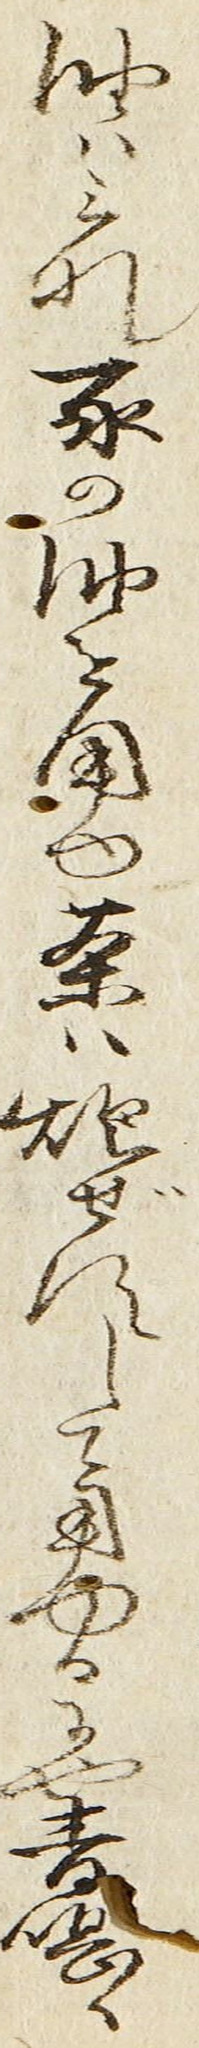油ハミな豕の油を用ゆ茶ハ炮ぜすして用ゆるにや青く
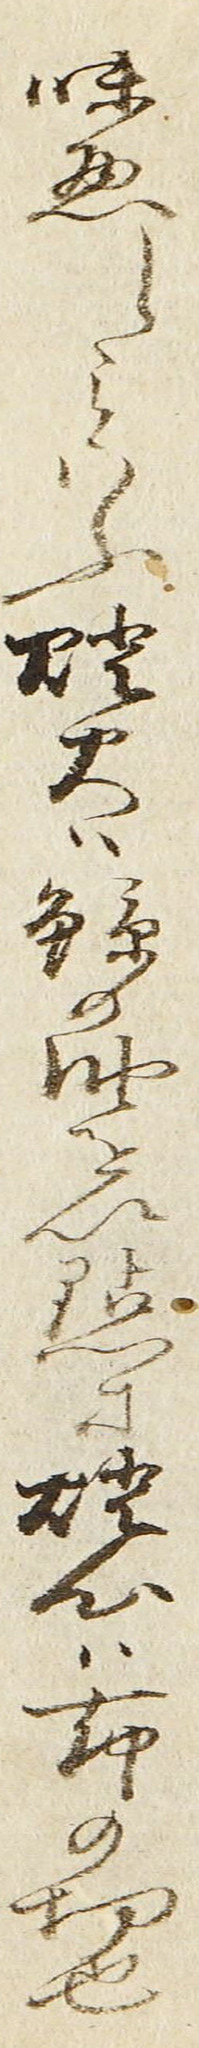味悪しくといふ燈火ハ鯨の油を以点す燈心ハ布の切也
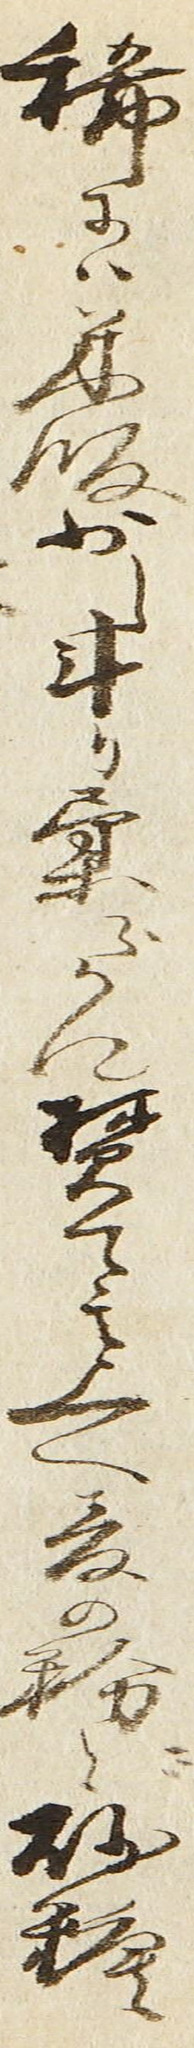稀にハ米飯少し計り柔らかに焚て其上へ麦の粉と砂糖
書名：亜墨利加漂流記聞
